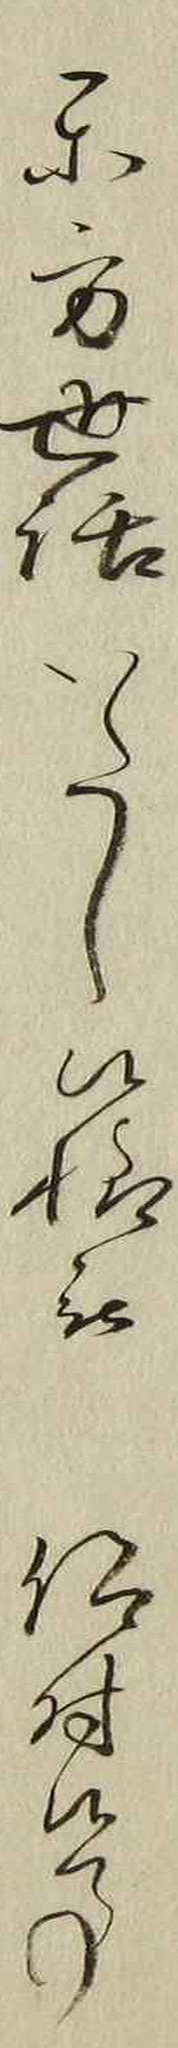楽方世話いたし候様被仰付候事
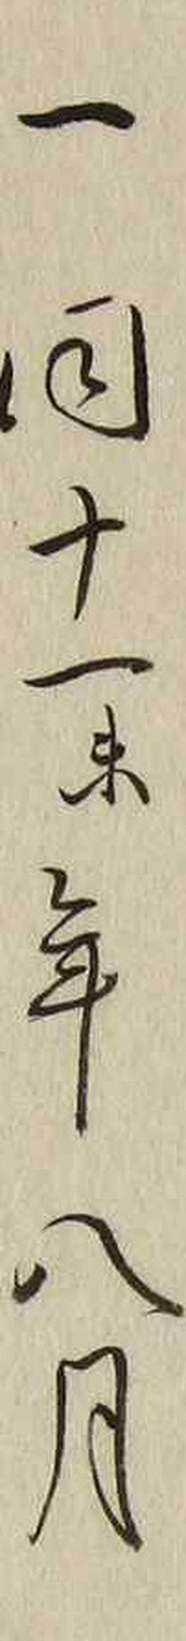一同十一未年八月
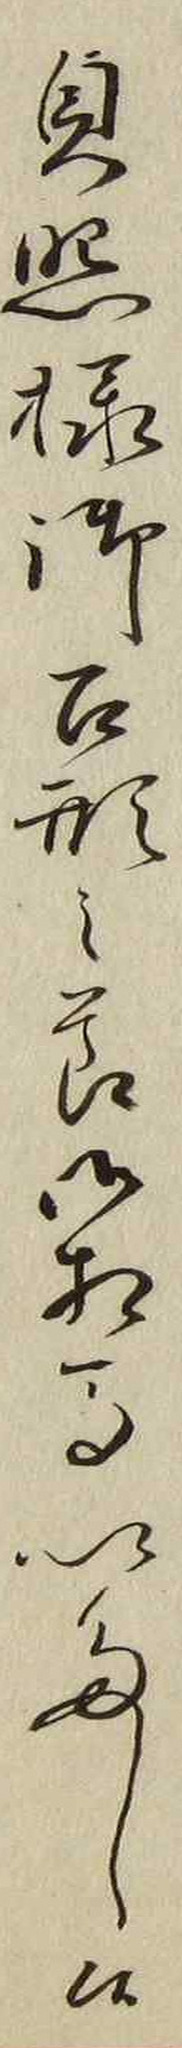貞照様御召形之節御相馬いたし候
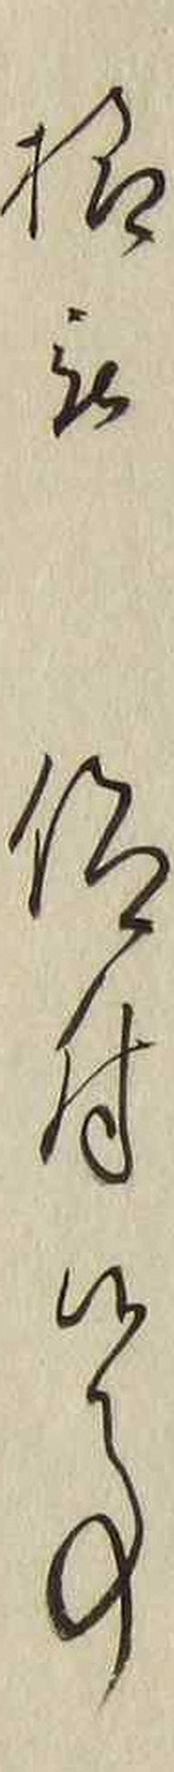様被仰付候事
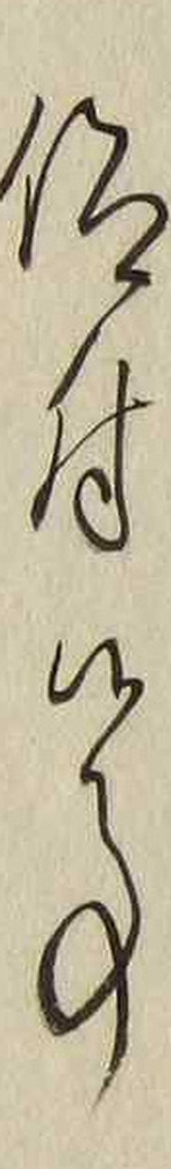仰付候事

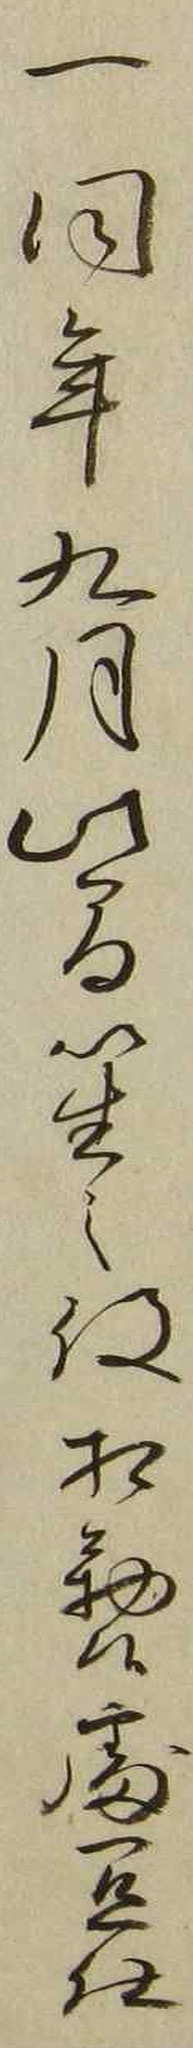一同年九月此間笙之役相勤候処宜仕
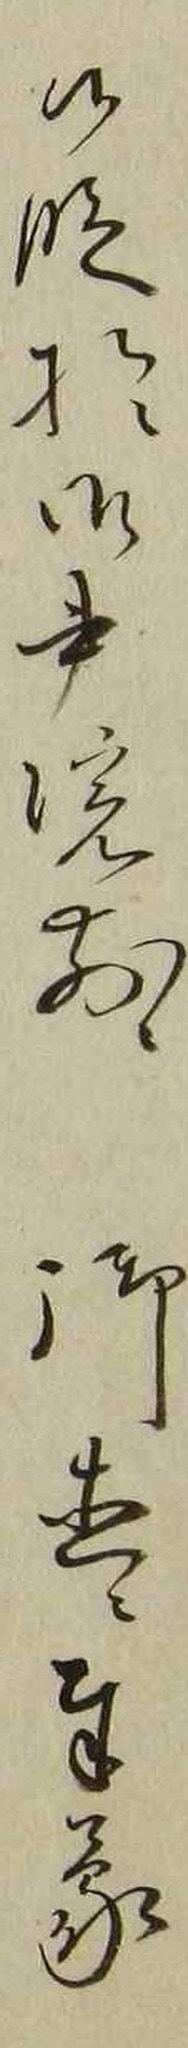候段於御書院前ニ御直に奉蒙
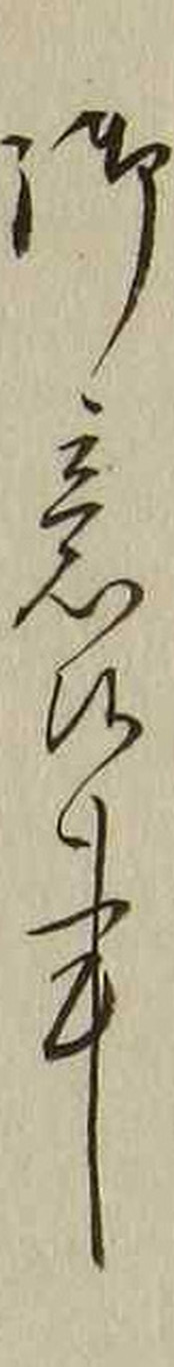御意候事
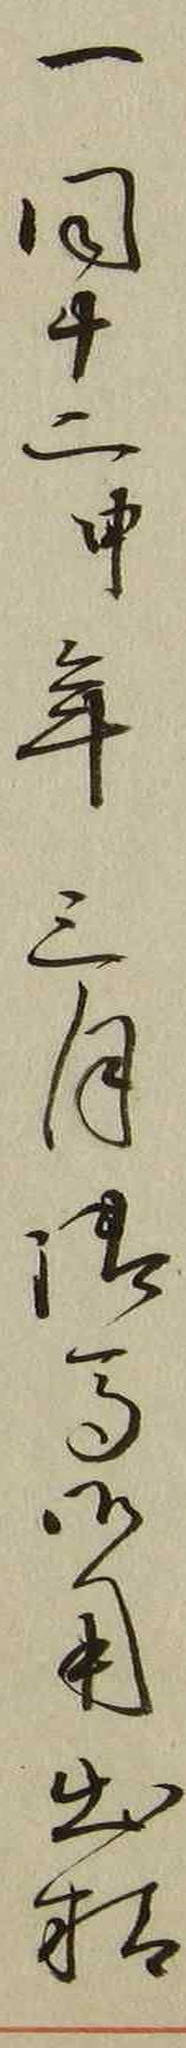一同十二申年三月御馬御用出精
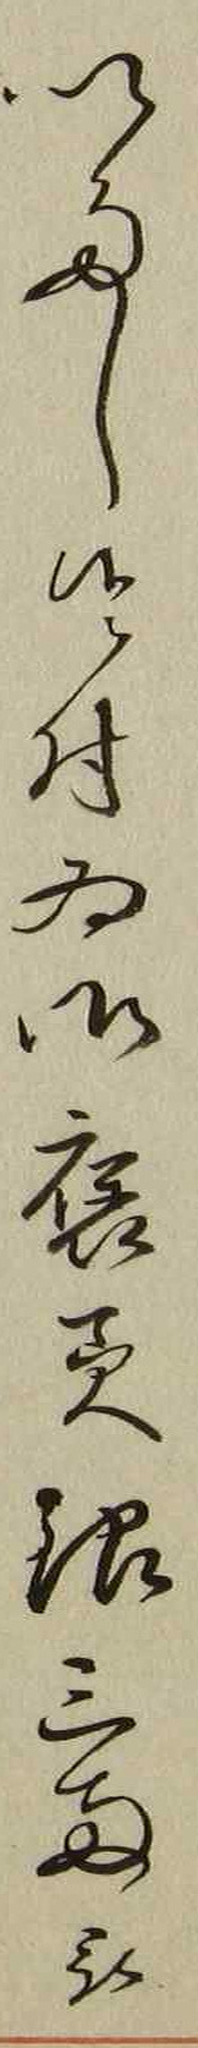いたし候に付為御褒美銀三両被
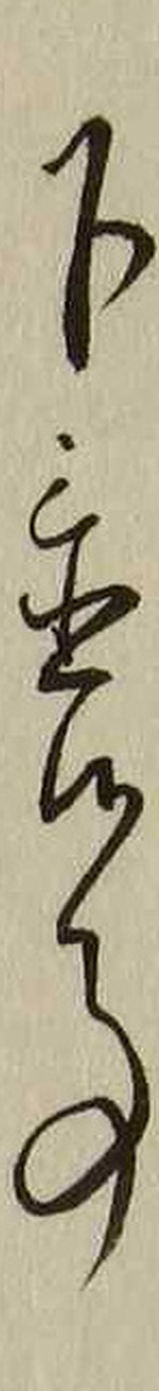下置候事
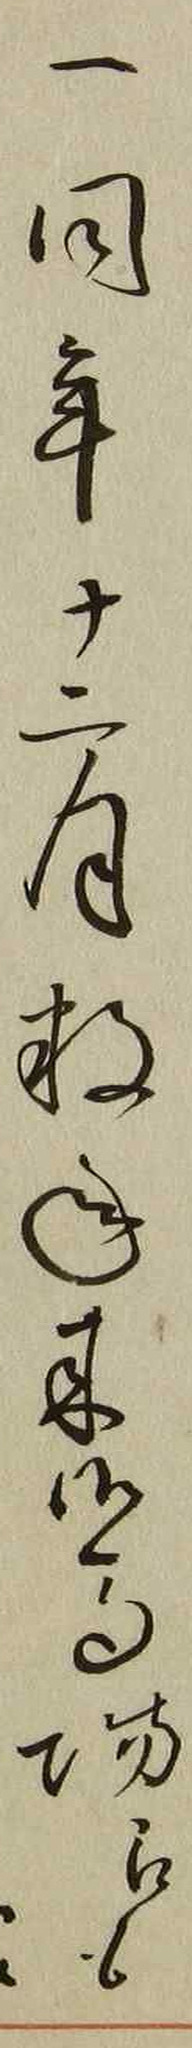一同年十二月数年来御馬場江も
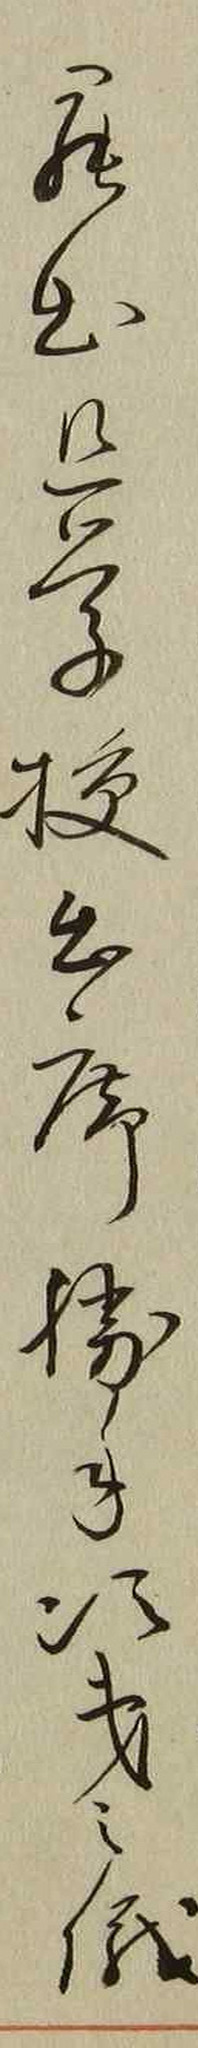罷出且学校出席勝手次第之儀
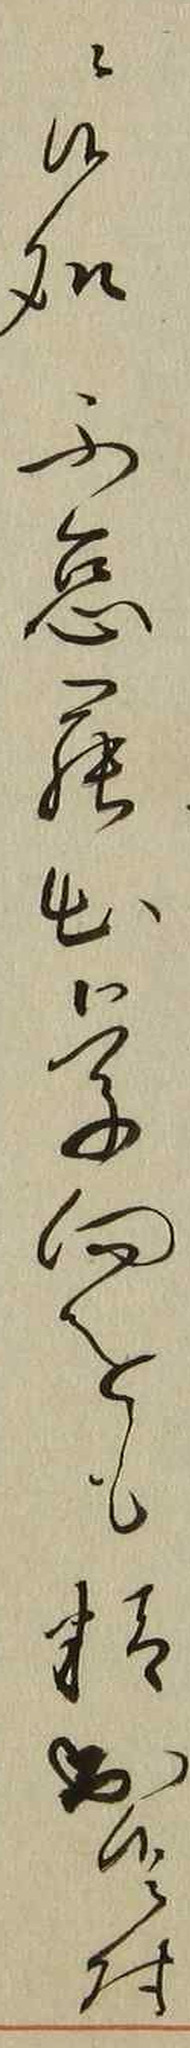に候処不怠罷出学向をも精出候に付
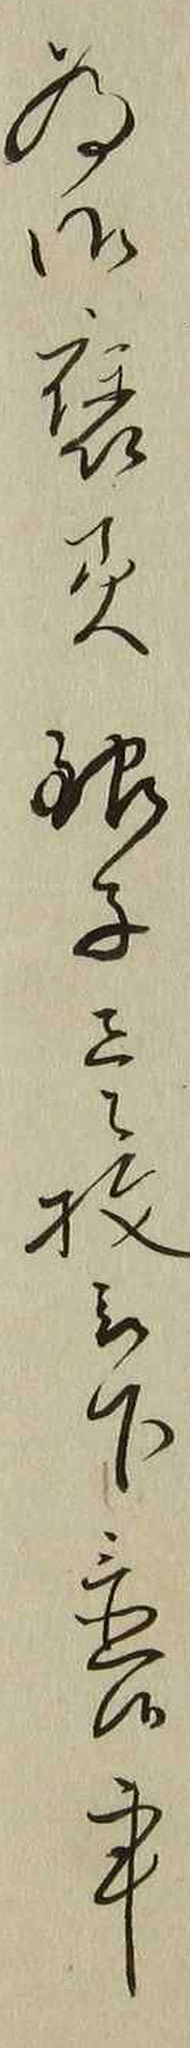為御褒美銀子壱枚被下置候事
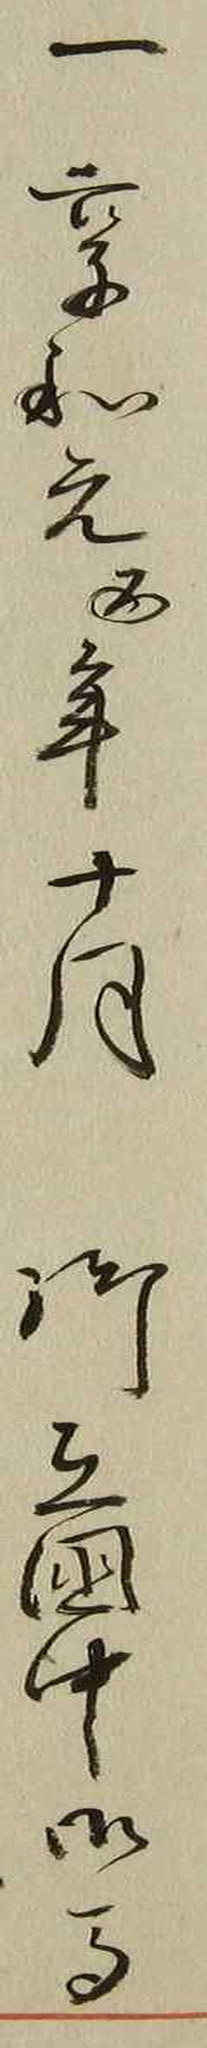一享和元酉年十月御在国中御馬
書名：諸士系譜　巻之3　い之部3
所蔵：会津若松市立会津図書館
